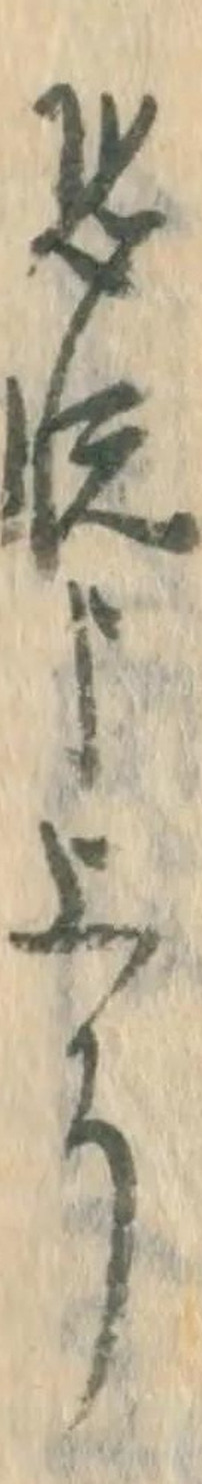恐悦申上候、

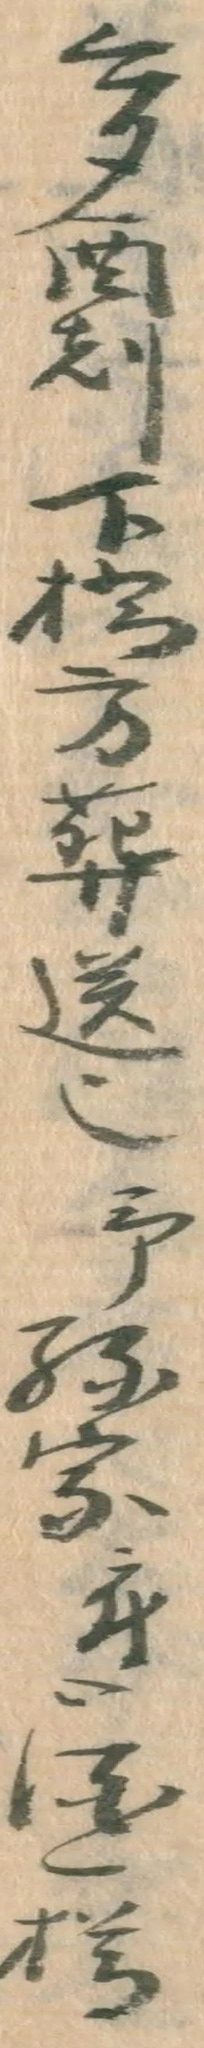今夕酉刻下橋方葬送也、予縁家ニ付御酒一樽
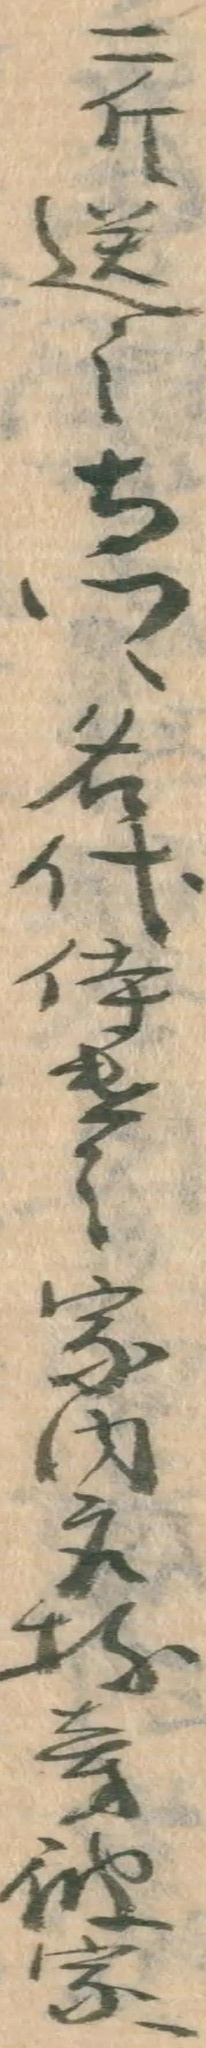二斤送之、寺門へ名代侍遣し、家内取持旁彼家へ
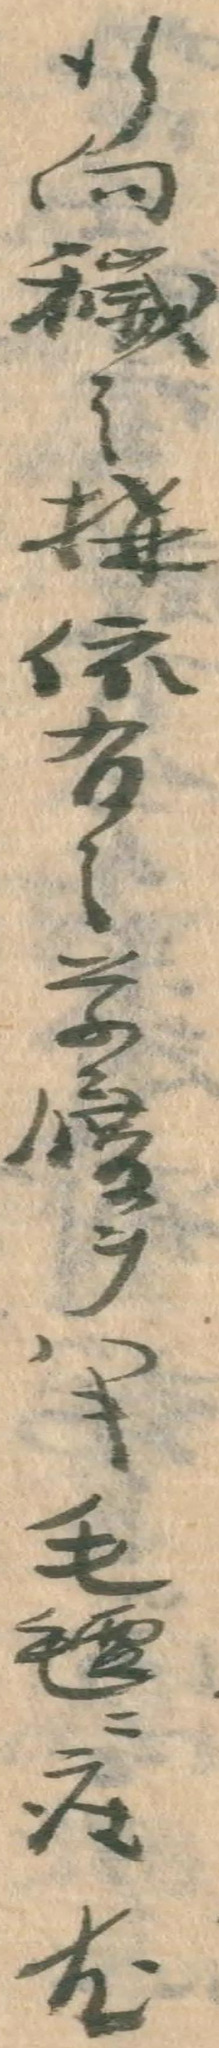行向、穢之構依有之、草履ヲハキ毛氈ニ座、尤
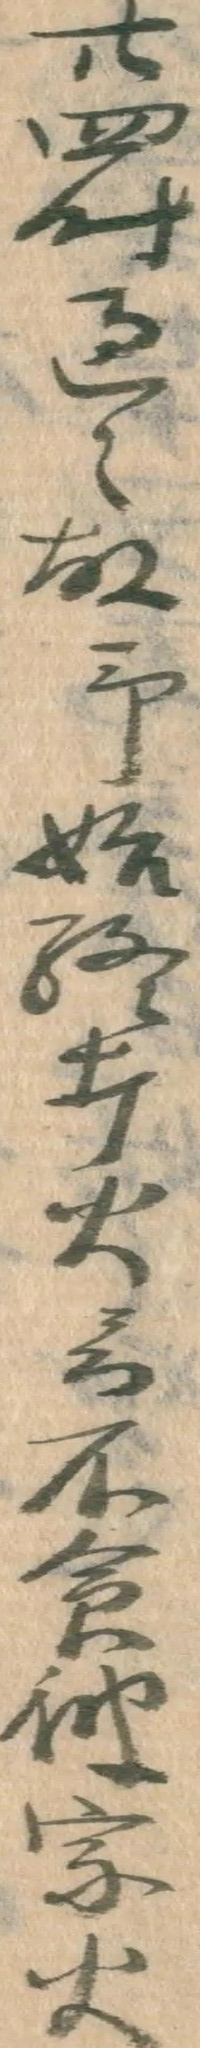廿四時過之故、予始終打火ニ而不食、彼家火
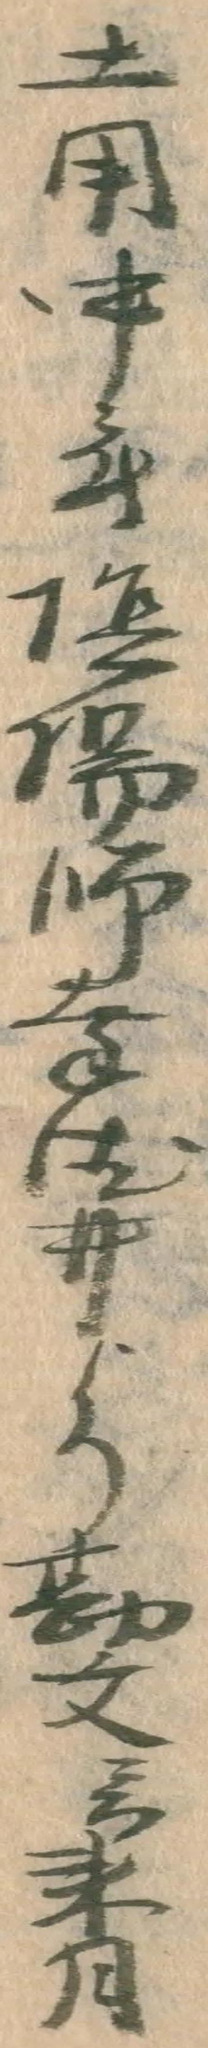土用中ニ付、陰陽師幸徳井より勘文ニ而来月
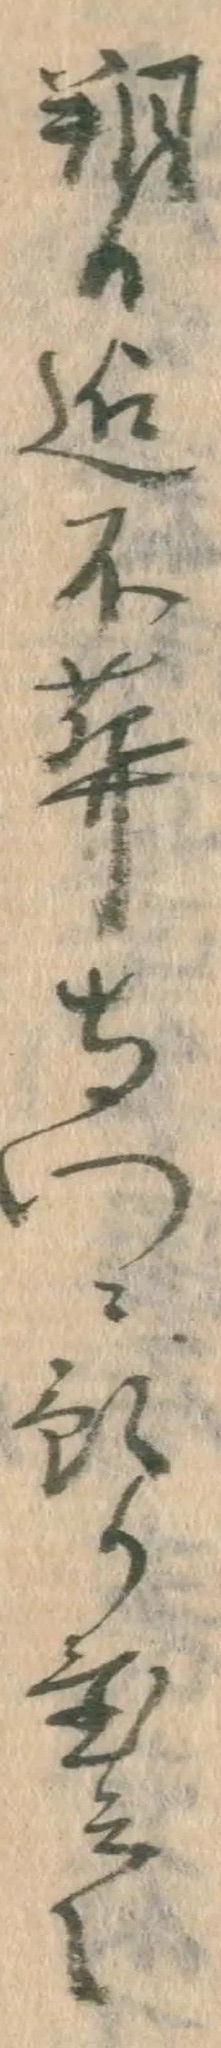朔日迄不葬、寺門ニ預り置云々、
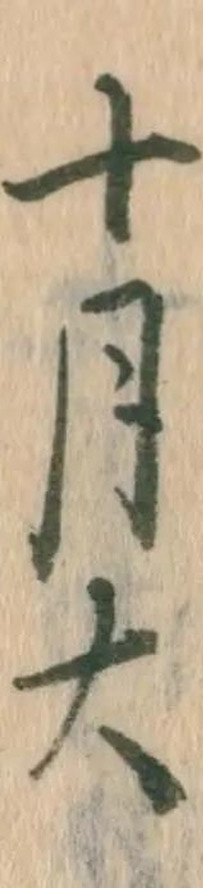十月大
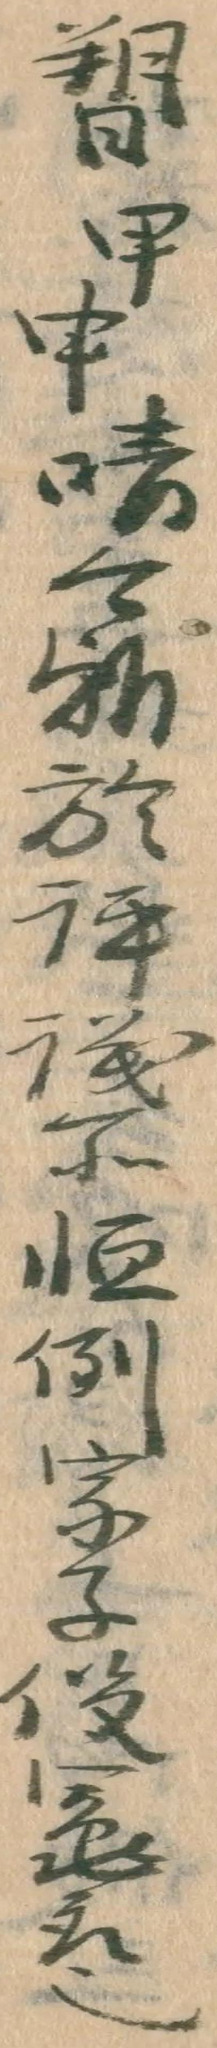朔日甲申晴、今朝於評議所恒例家子役鬮取也、
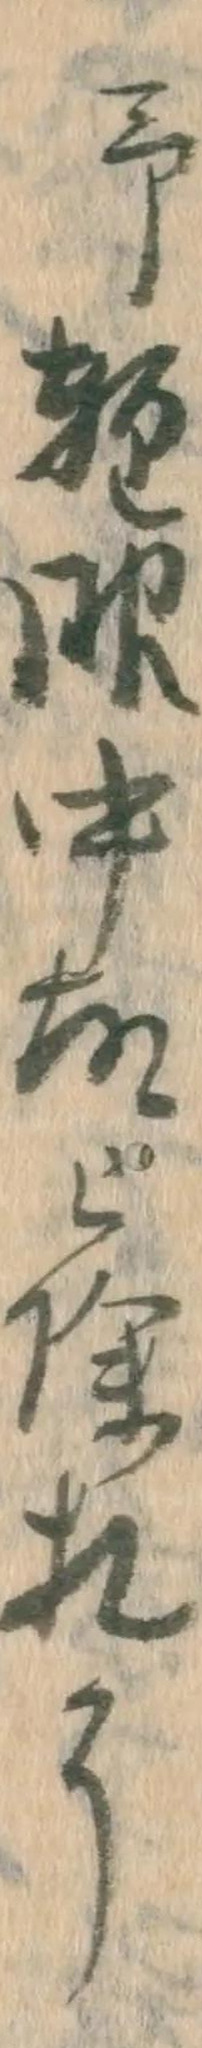予軽明中故被除札了、
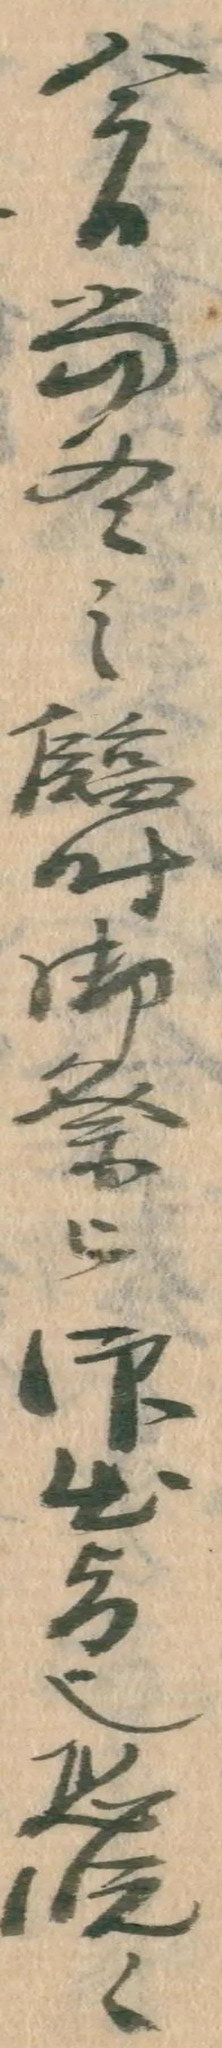今日當冬之臨時御祭被仰出旨也、恐悦候、
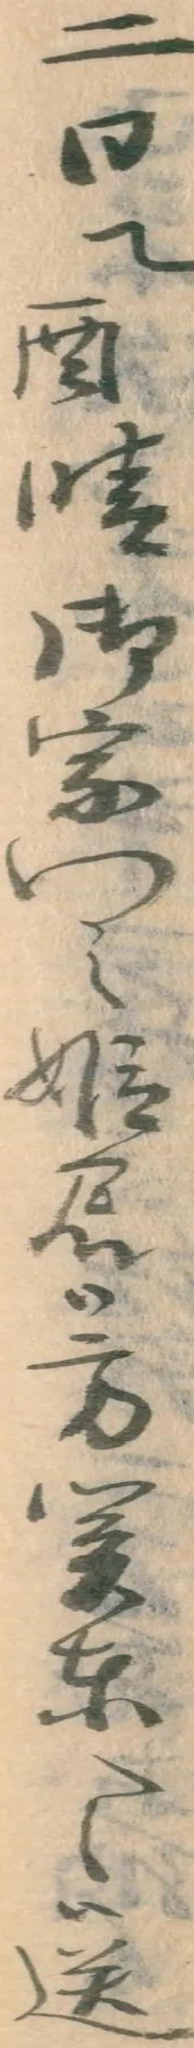二日乙酉晴、御家門之姫君御方関東へ之御送
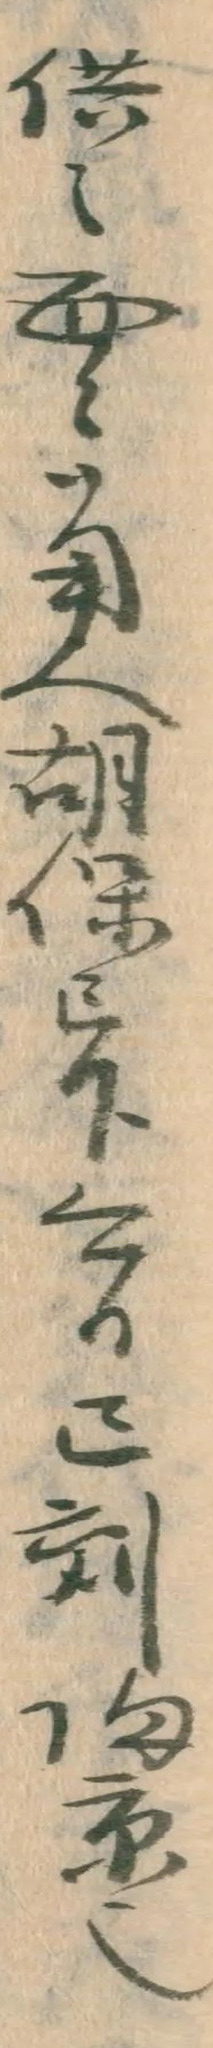供之面々、御用人胡保已下今日巳刻帰京也、
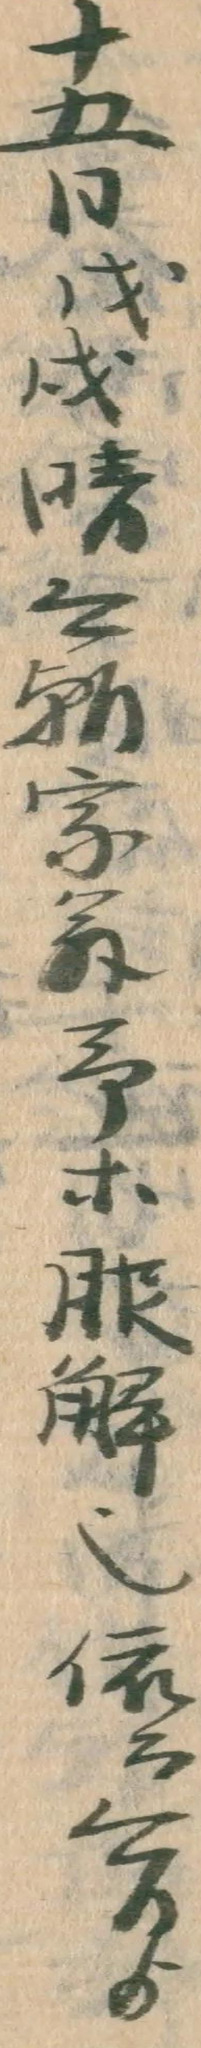十五日戊戌晴、今朝家翁・予等服解也、依而今日ゟ
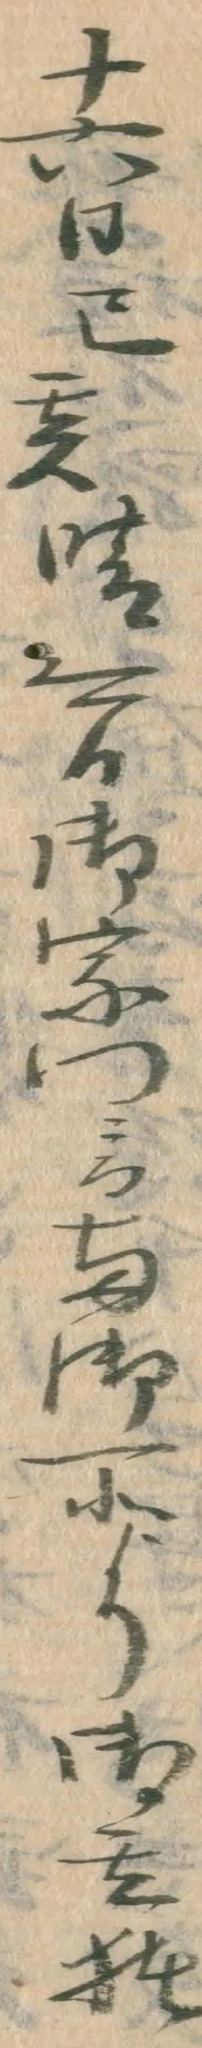十六日己亥晴、六日御家門二而両御所より御玄猪
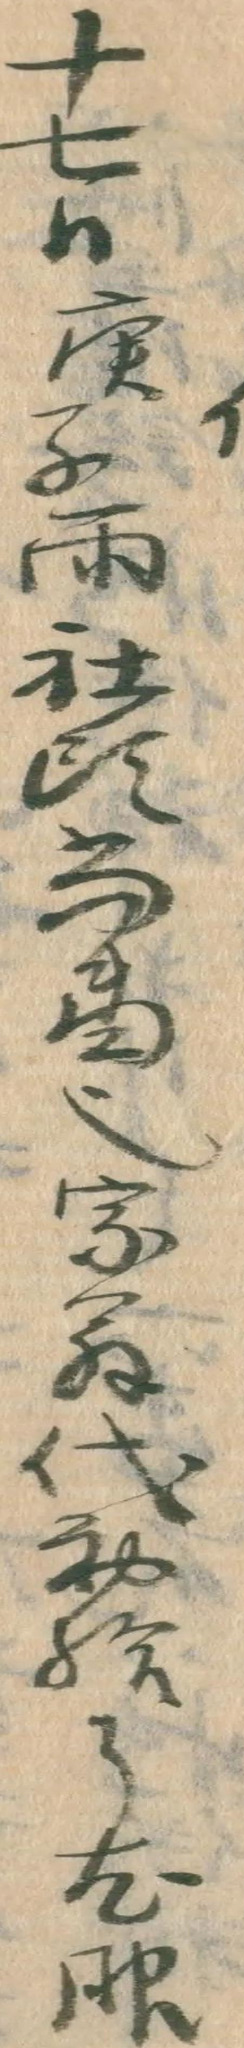十七日庚子雨、社頭當番也、家翁代勤給了、尤服
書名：賀茂社記録. 第63冊
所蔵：国立国会図書館 National Diet Library, JAPAN
